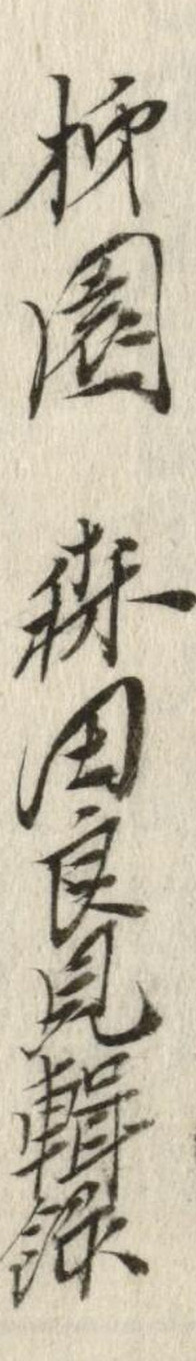柹園森田良見輯録

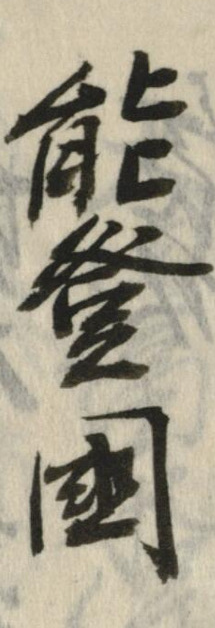能登國
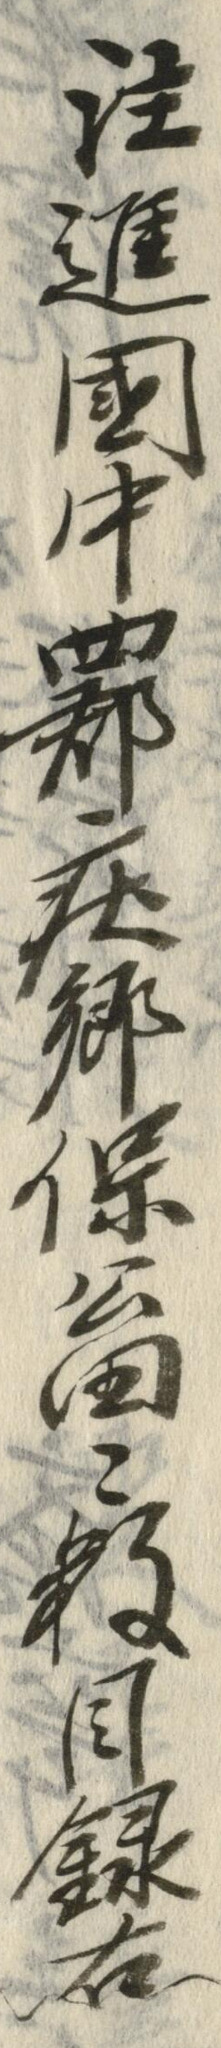中心國中四郡庄郷保公田々数目録右
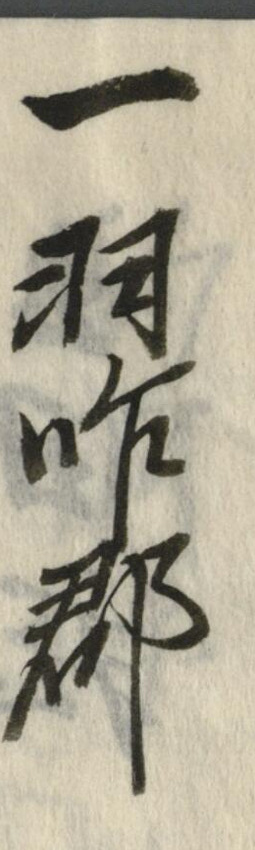一羽咋郡
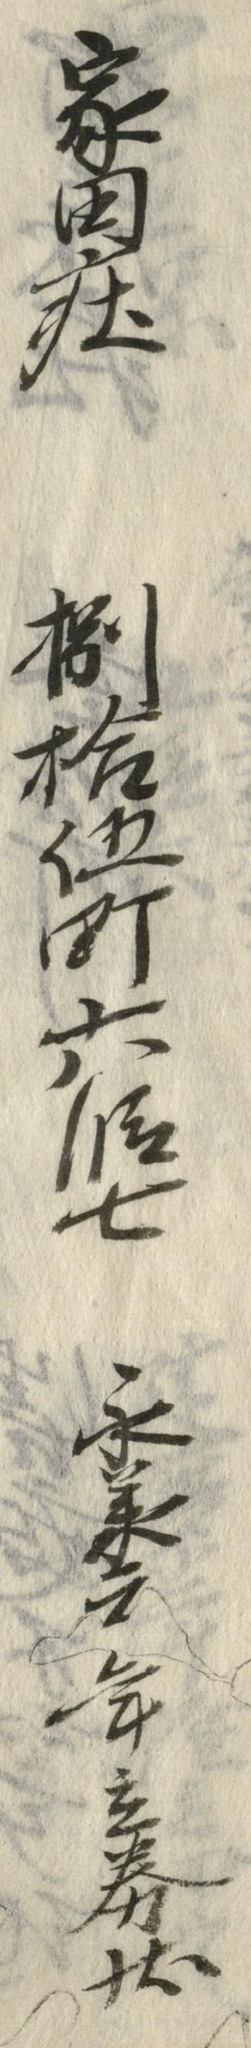家田庄捌拾伍町六段七永承六年立券状
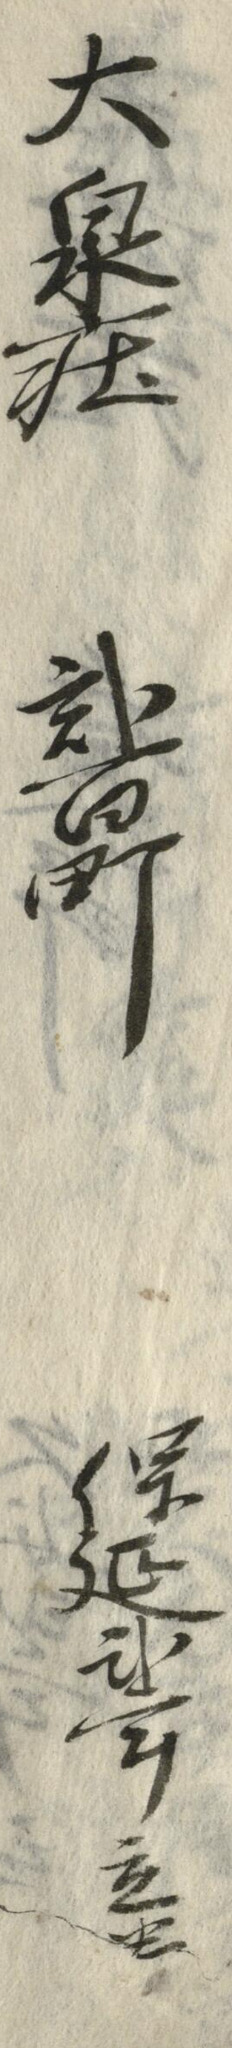大泉庄ニ百町保延弐年立券
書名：続汲古北徴録
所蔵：Ishikawa Prefectural Library
